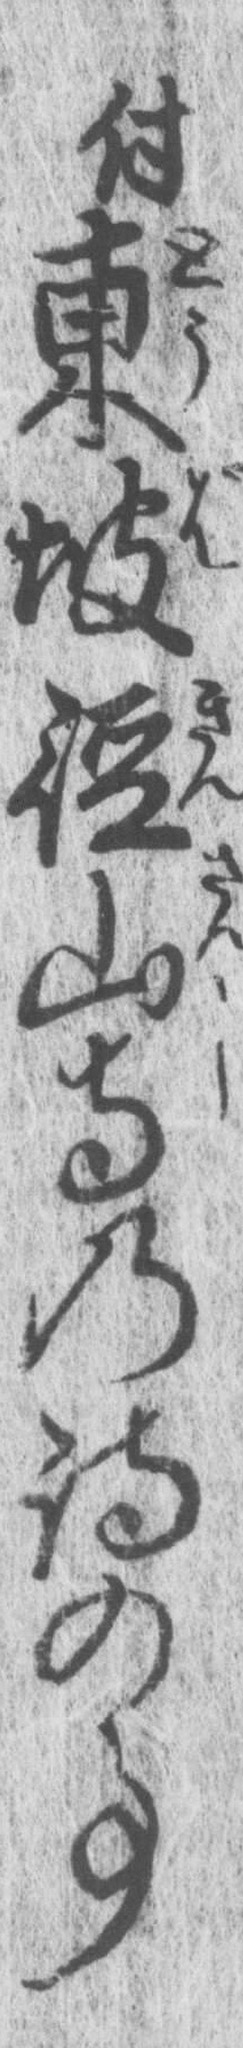付東坡径山寺の詩の事
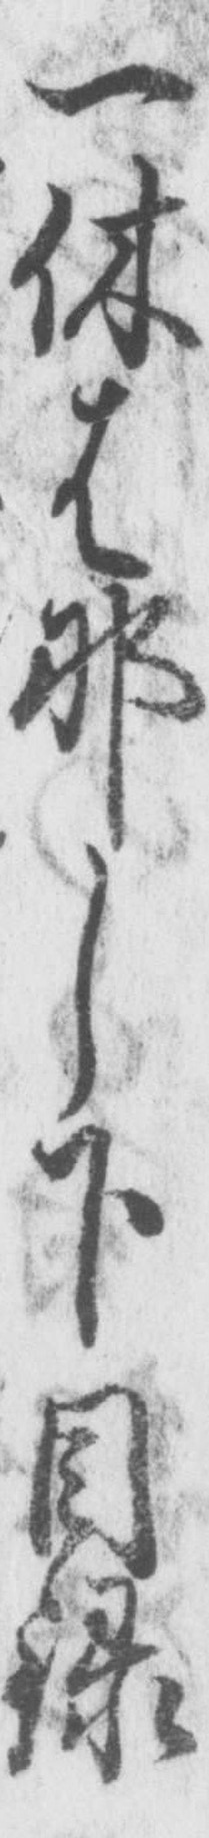一休はなし下目録
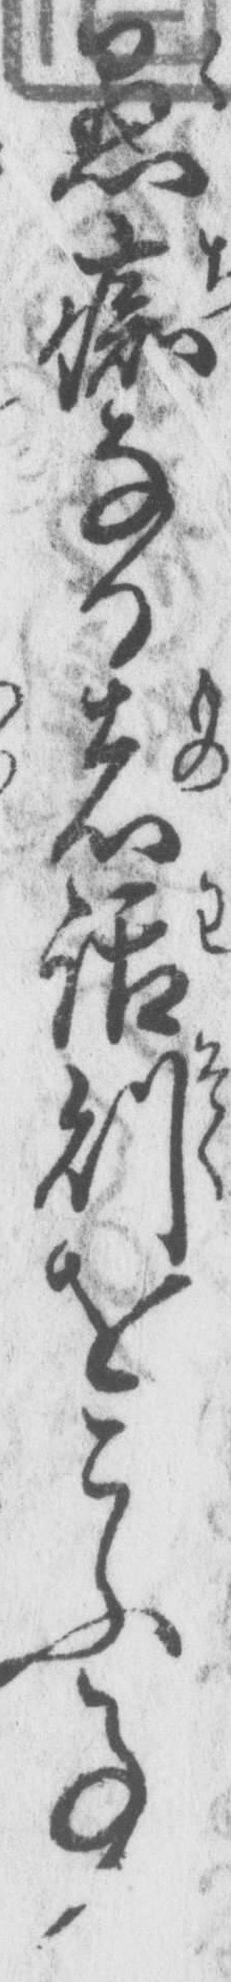二愚痴なる者話則をこふ事
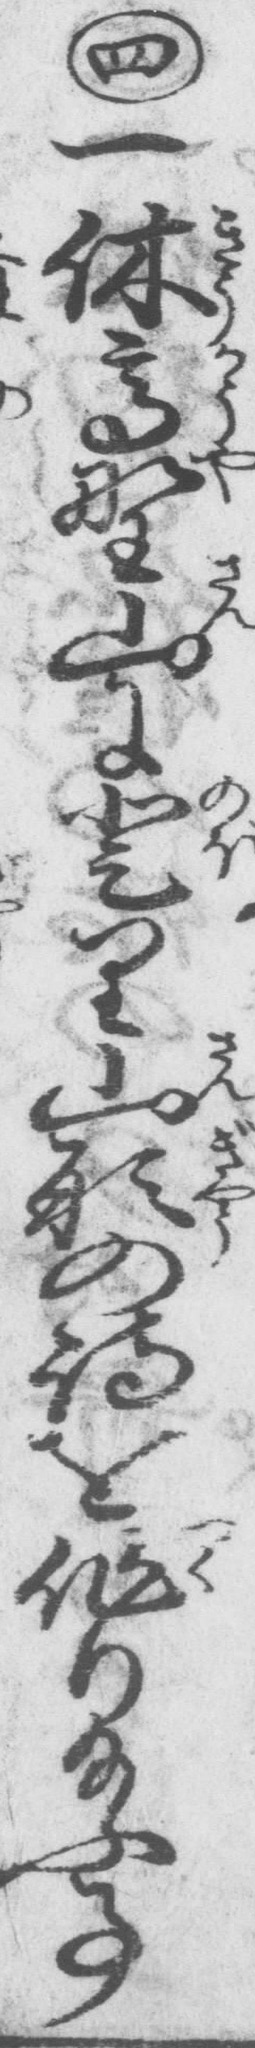四一休高野山に登り山形の詩を作り給ふ事
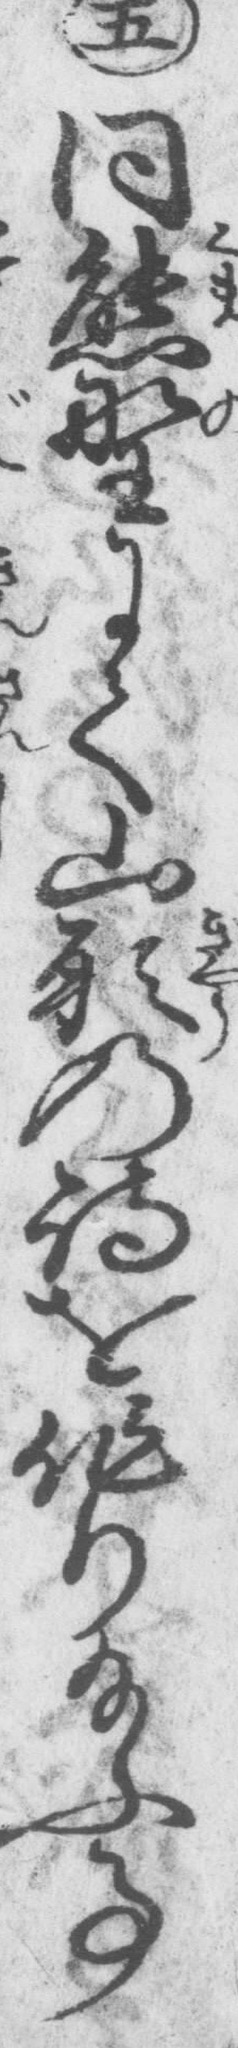五同熊野にて山形の詩を作り給ふ事
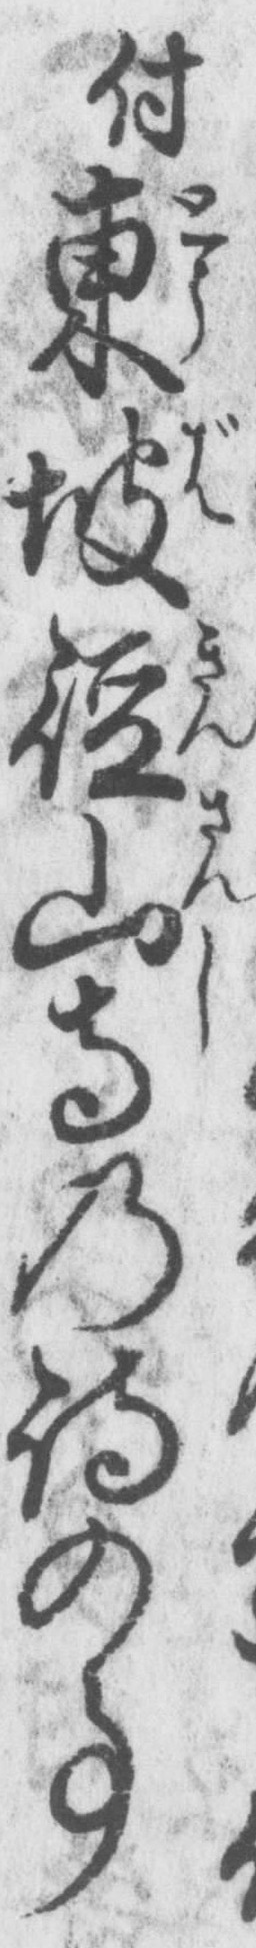付東坡径山寺の詩の事
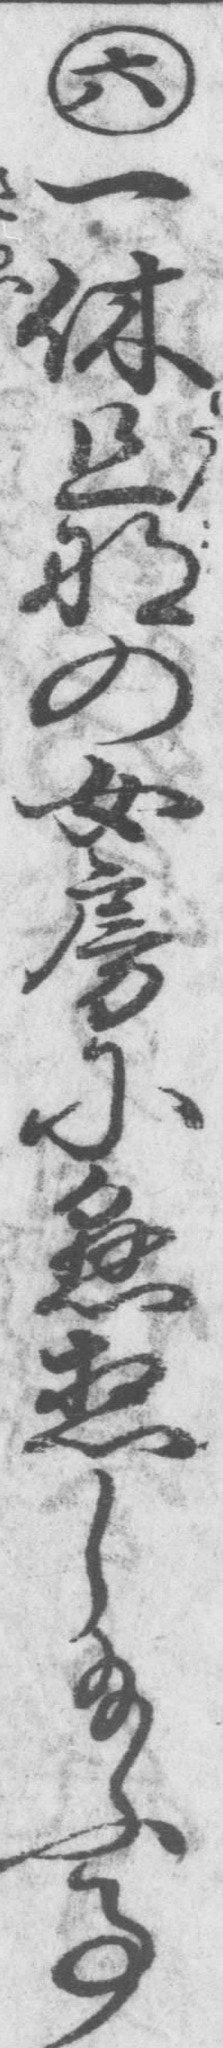六一休旦那の女房に懸想し給ふ事
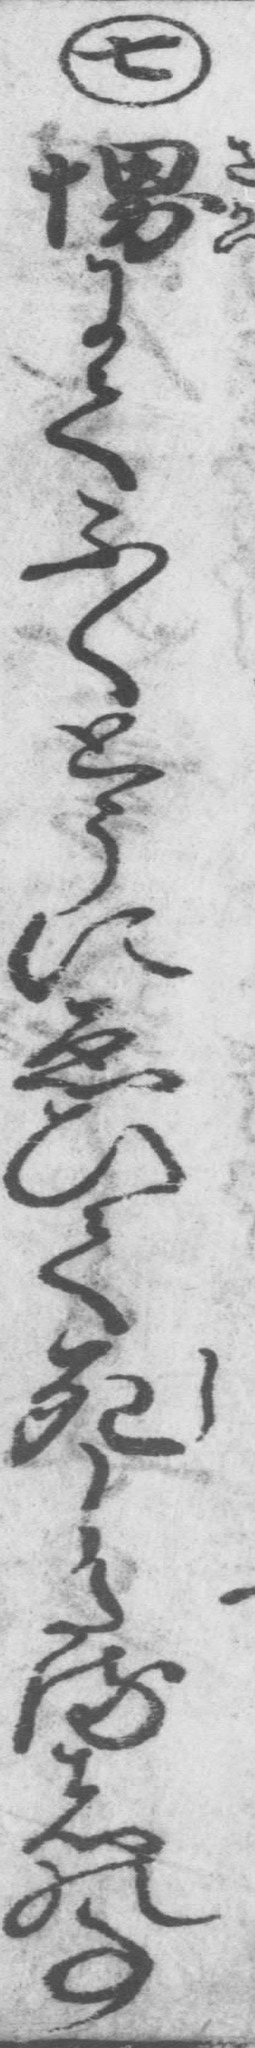七堺にてふくとうにゑひて死したるしの事

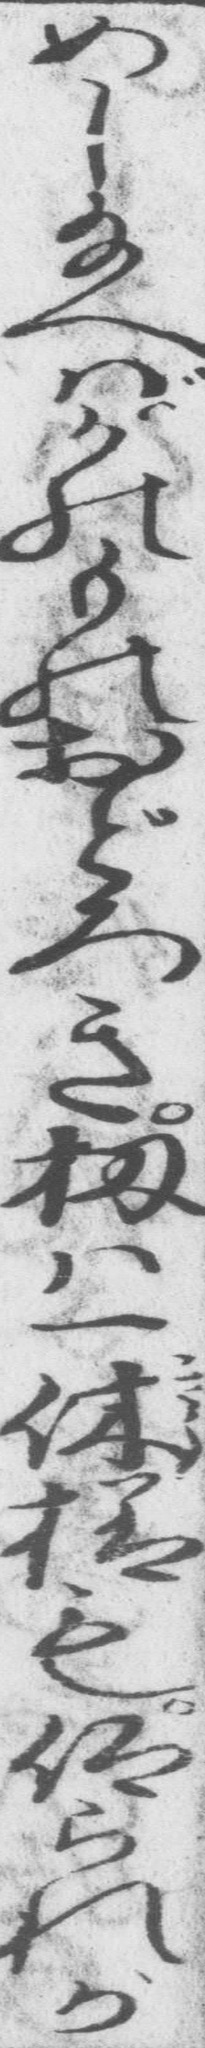めし給へば。かのものおどろき。扨は一休様も仰られが
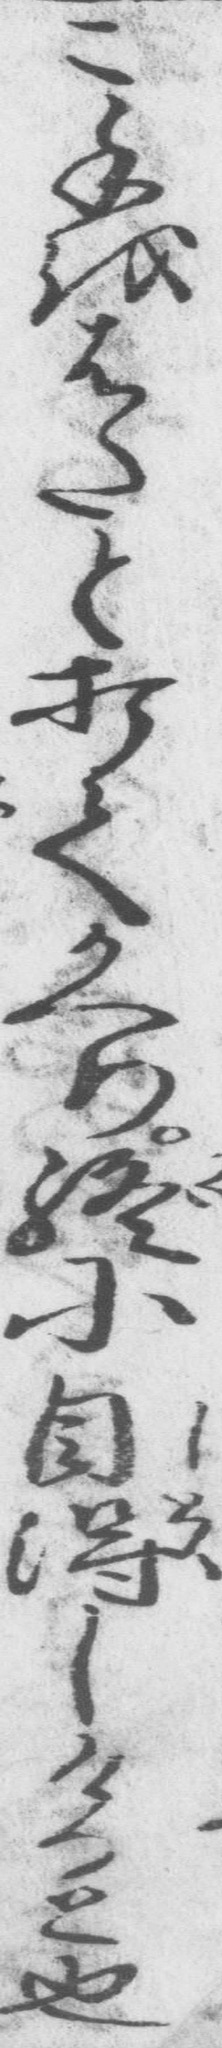こ手をはたと打てかへり。終に自得しけると也
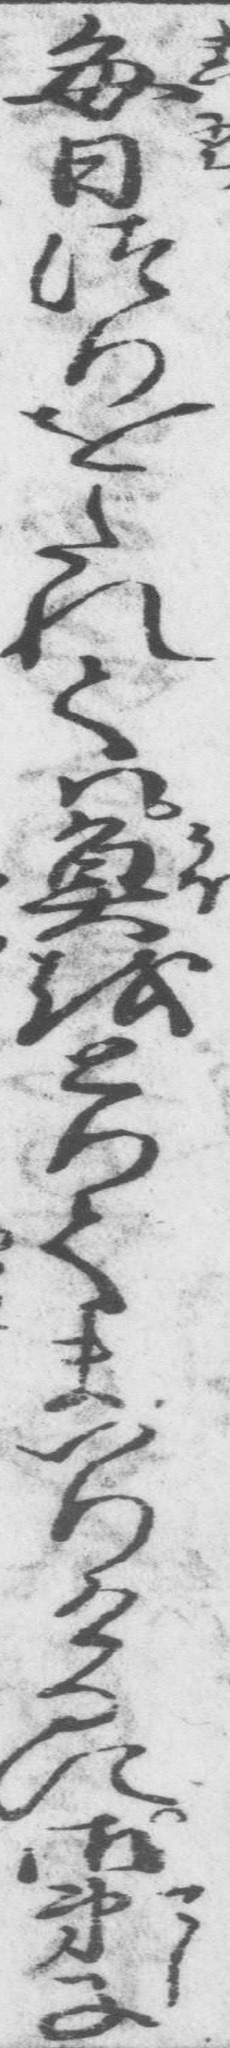毎日つりをたれては。魚をとりてまいりけるに。御弟子
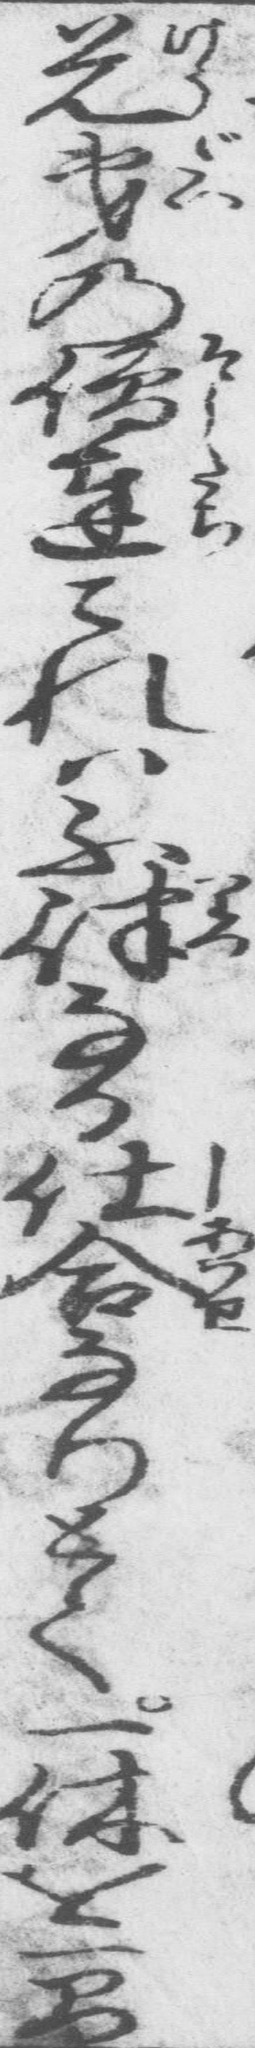兄弟の僧達これは不律なる仕合なりとて。一休を一間
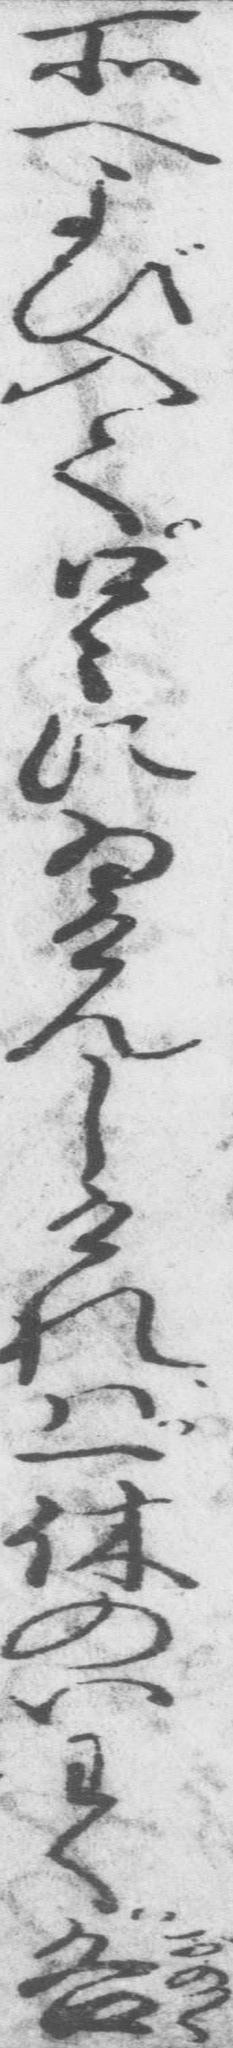所へよび入て。口々にゐけんしければ一休のいわく。各
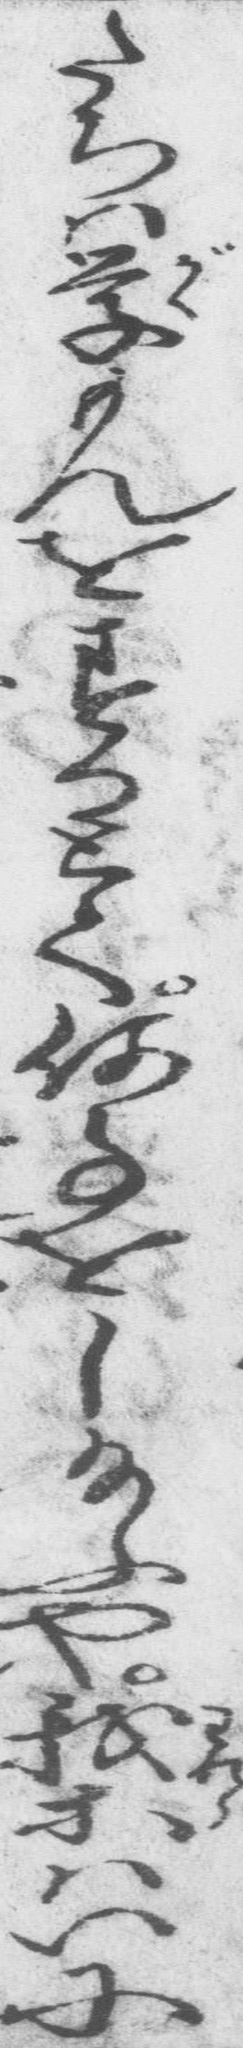たちは学もんをするとて。何事をし給ふや。我等はいに
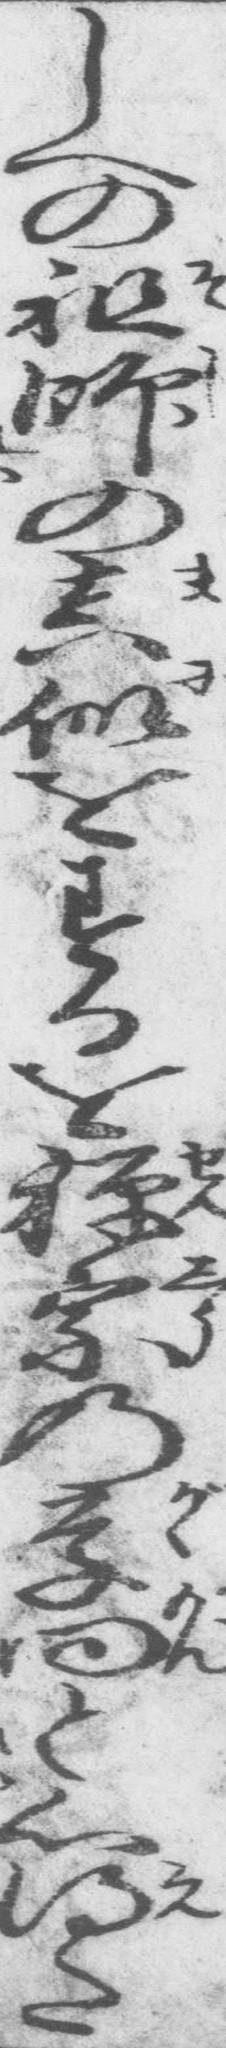しへの祖師の真似をするを禅宗の学問と心得た
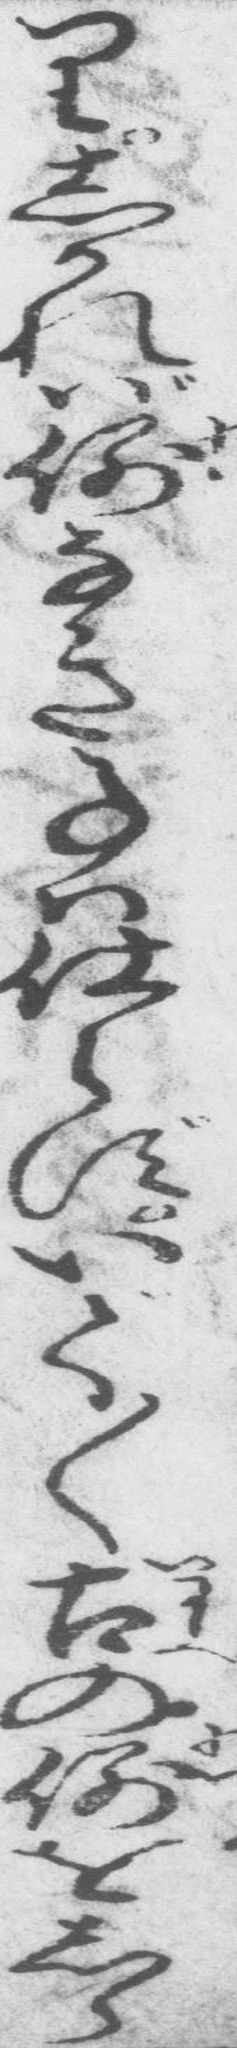り。しかれば例なき事は仕らず。いて〳〵古の例をしら
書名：一休はなし（元禄十三）
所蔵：大阪公立大学中百舌鳥図書館 国文学研究資料館
